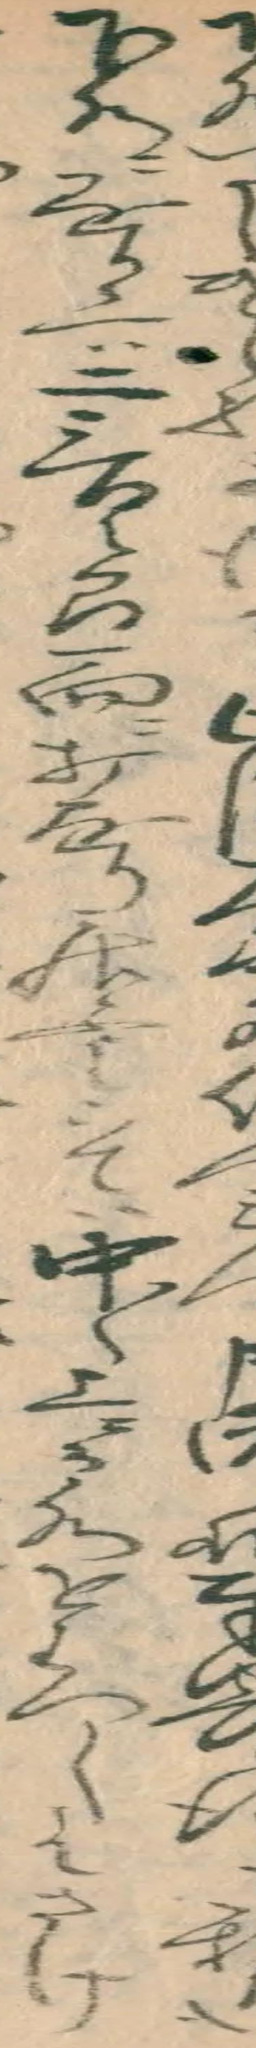下水ニ懸り候ヘハ二三日之間一向ニ打懸り居不申候てハ中〳〵上ニ而水をはつし候てさけ
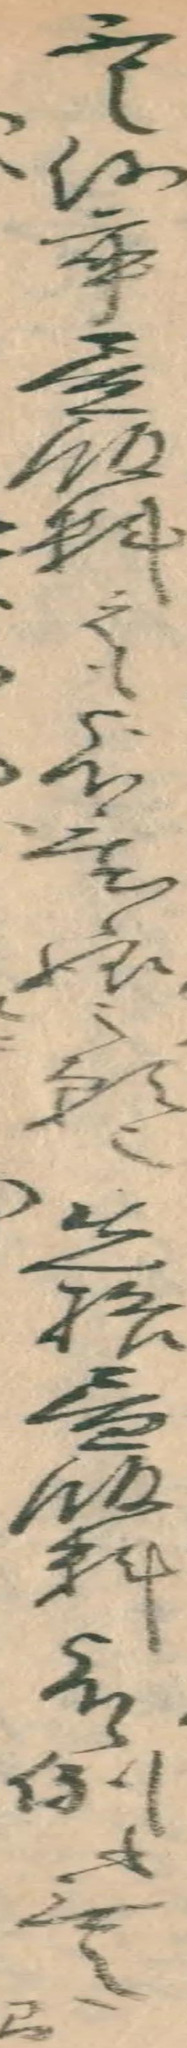不申候何卒昼飯料ニても被下置候様之願也先格昼飯料被下候例も無之候間
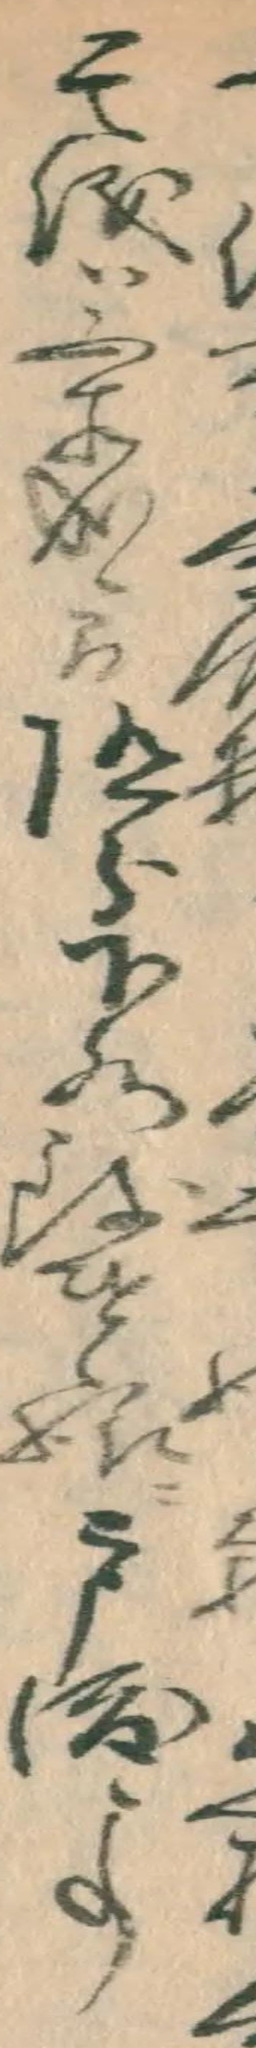其儀ハ不相成候間随分下水致遣候様ニ被申渡候事
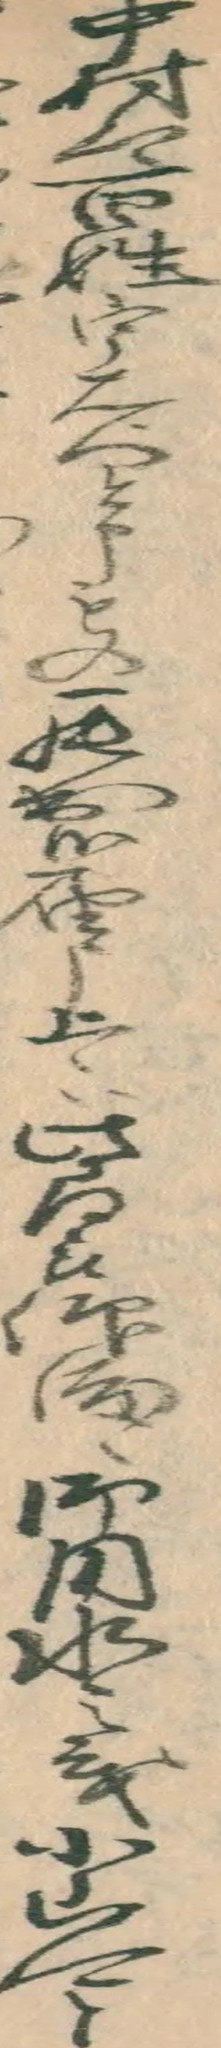一中村郷百姓宇右衛門と申もの罷出御届申上候ハ此間被仰渡候御用水之義小山郷と
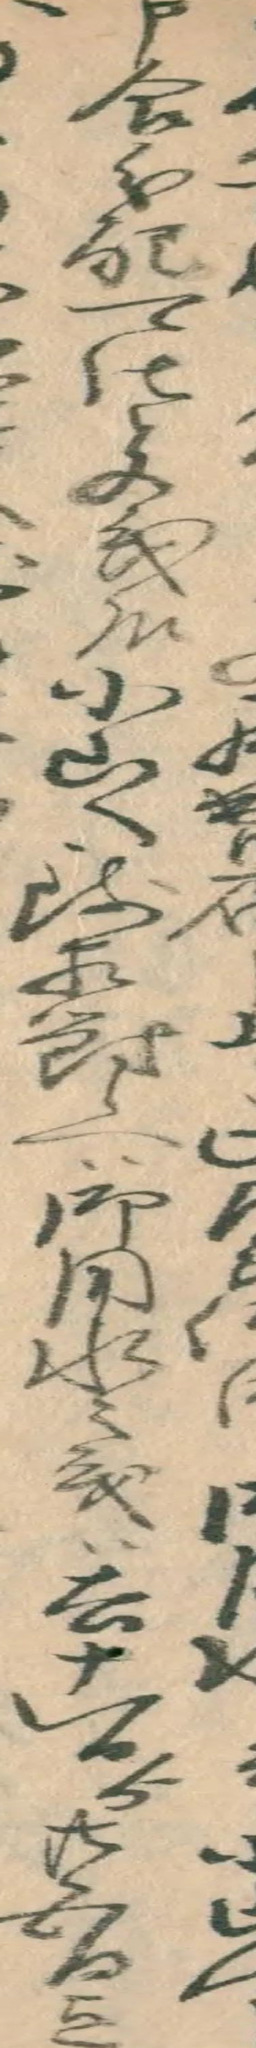申合分配可仕との義故小山へ致相対候へハ御用水之義ハ去十八日ゟ廿五日迄
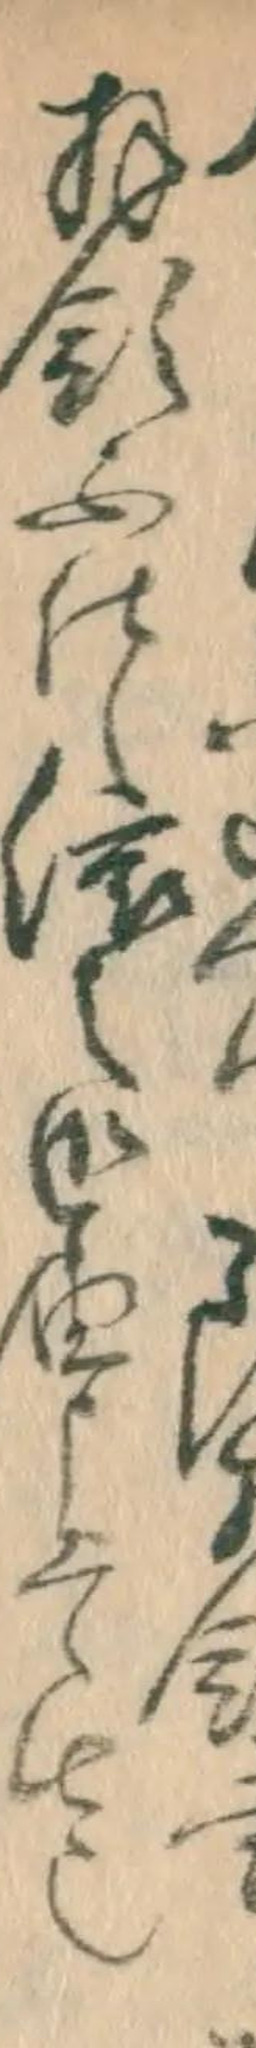拝領不仕候依之御届申上候由也
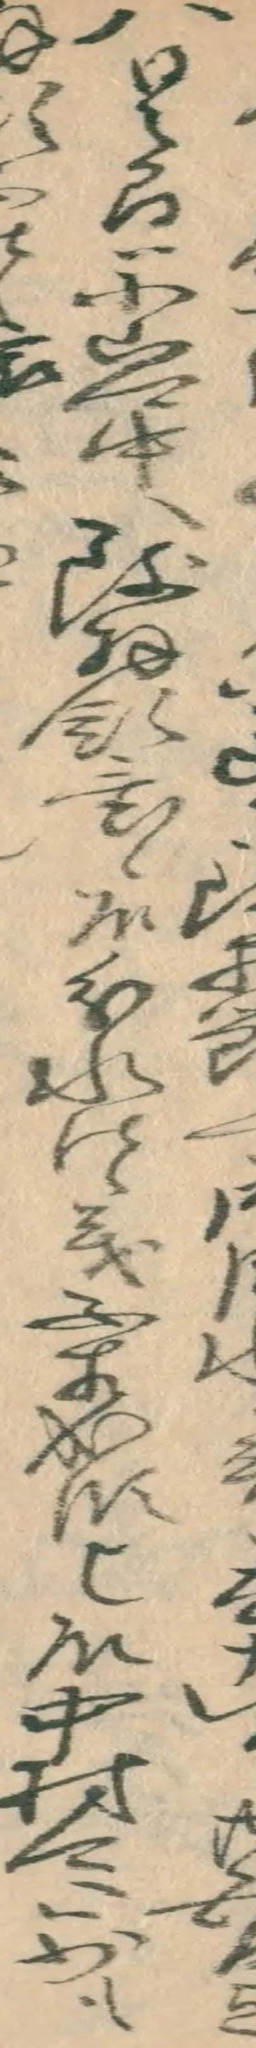八日之間ハ小山郷中へ致拝領置候故分水仕候義不相成段申候故中村郷へハ少も
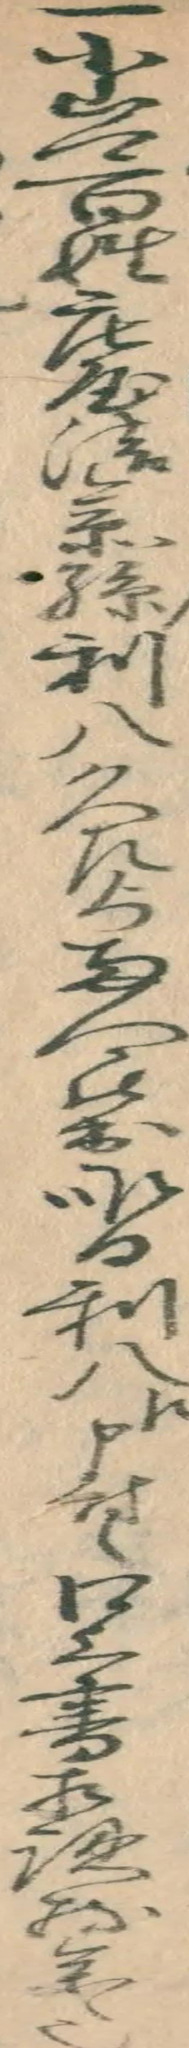一小山郷百姓庄屋清兵衛孫利八久左衛門両人罷出昨日利八江申付候口上書相認持参候也
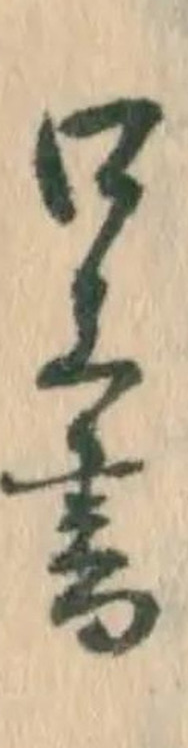口上書
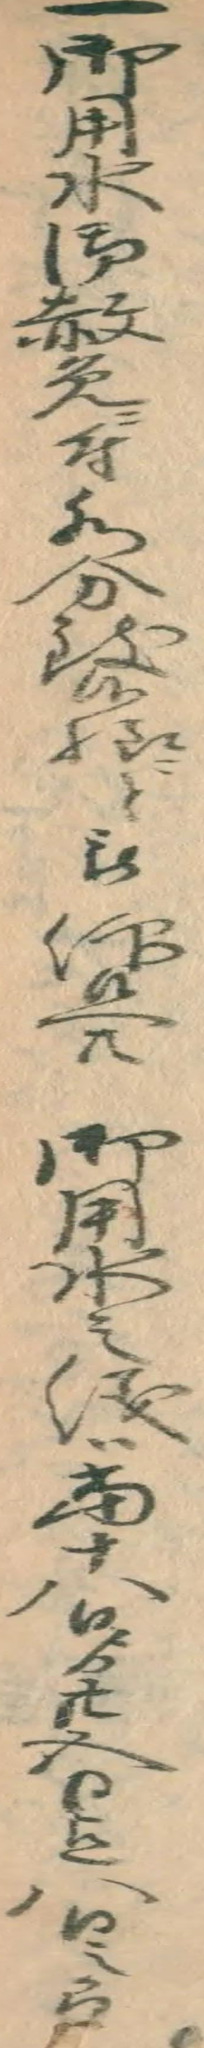一御用水御赦免ニ付水分致候様ニと被仰候へ共御用水之儀ハ当十八日ゟ廿五日迄八日之間

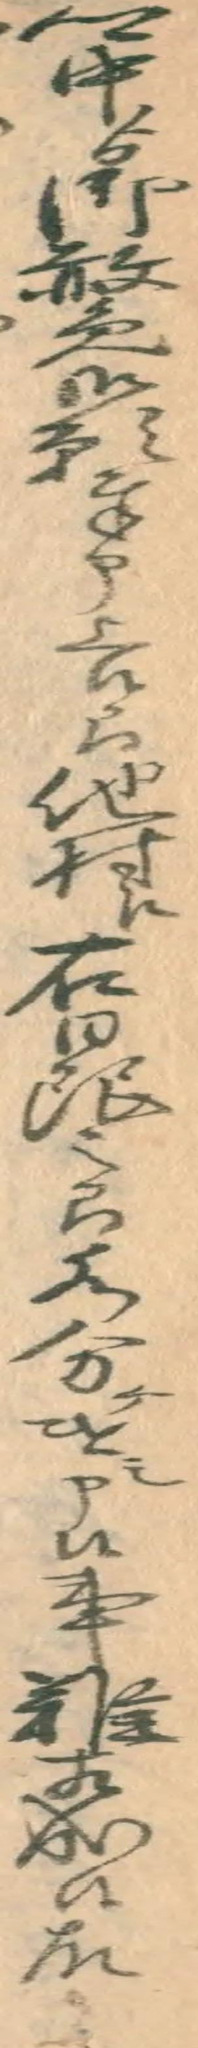郷中ゟ御赦免御願奉申上候間他村江右日限之間水分ケ遣シ申候事難相成候故
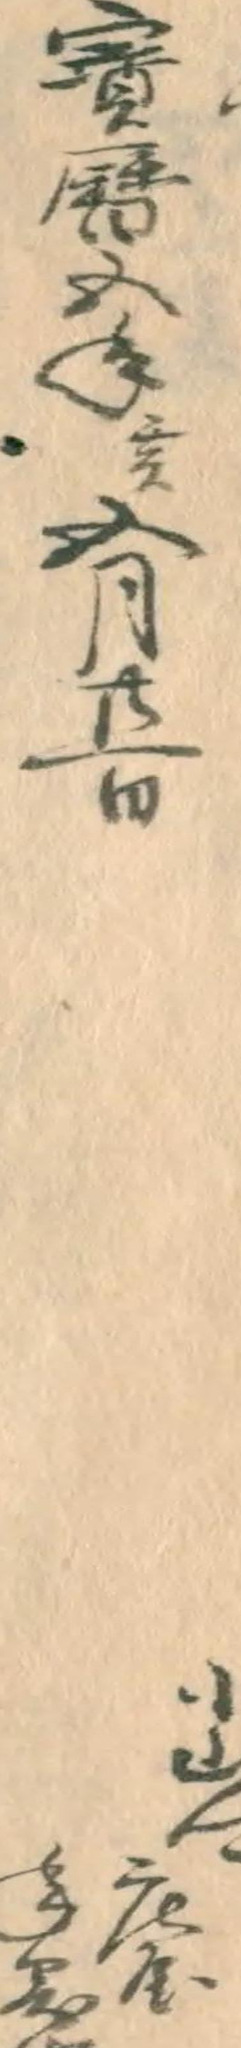宝暦五年亥五月廿一日庄屋
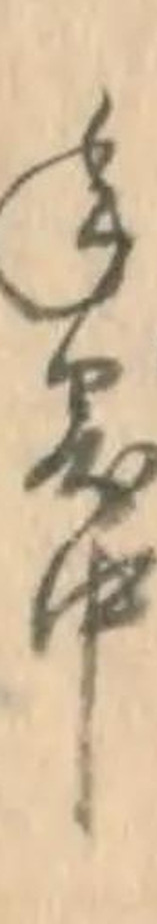年寄中
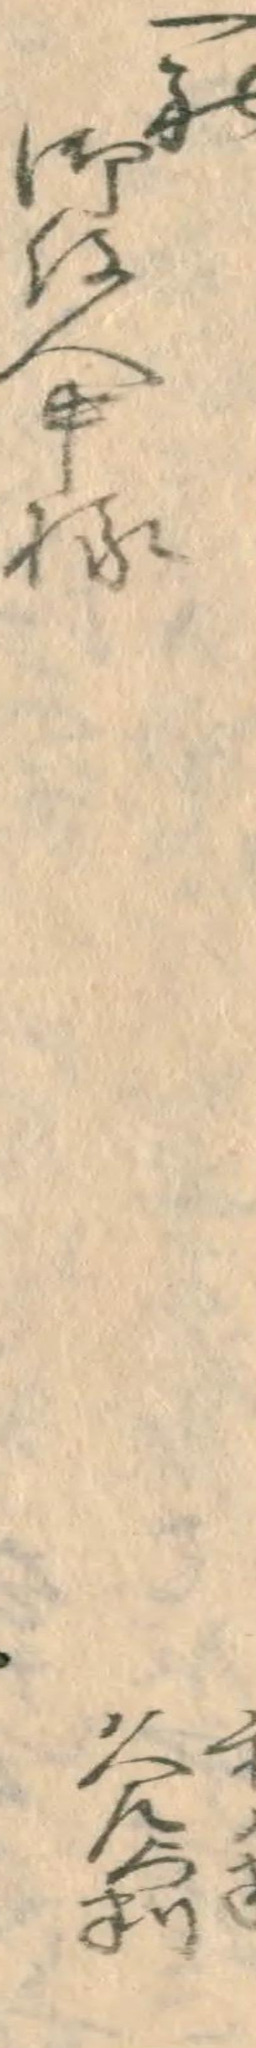御役人中様久左衛門判
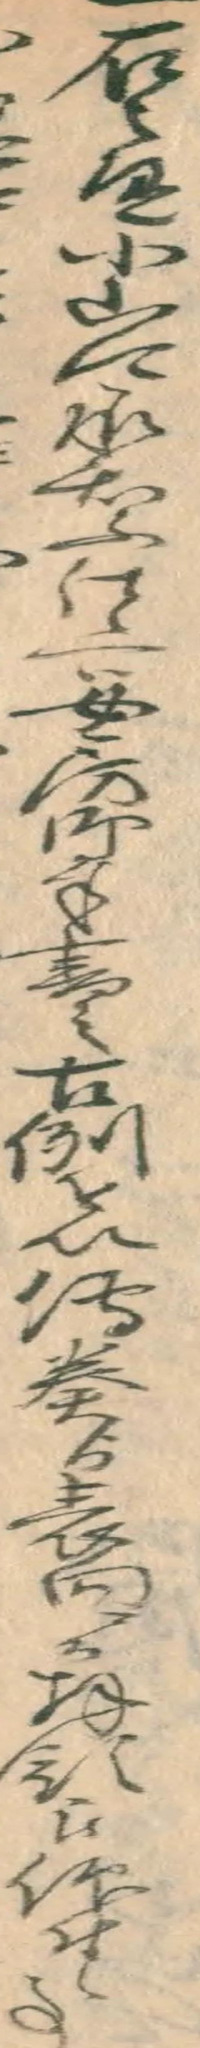一右之通小山郷承知不仕候へハ女房御奉書之古例を以伝奏ゟ表向ニ而拝領被仰付候事
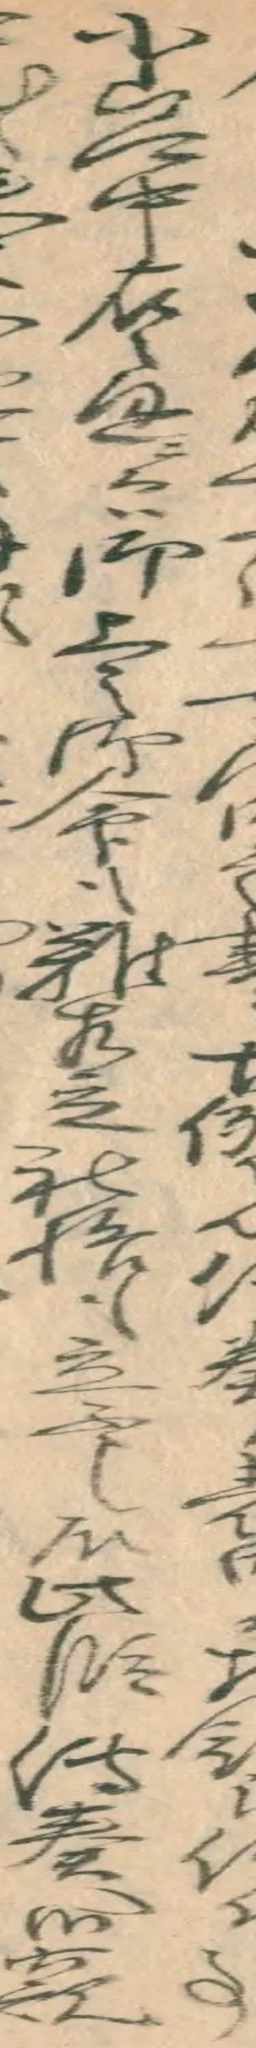小山郷中右之通ニ而ハ御上之御命も難相立社格も立不申候故此段伝奏へ御窺
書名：賀茂社記録. 第58冊
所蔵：国立国会図書館 National Diet Library, JAPAN
